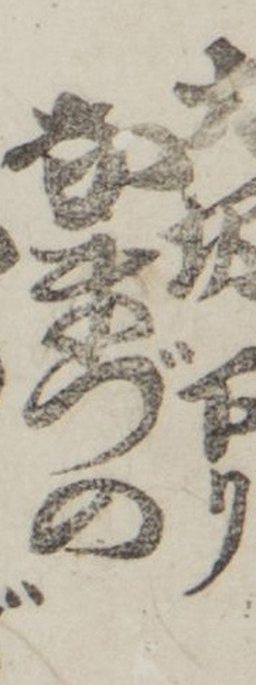なまづの
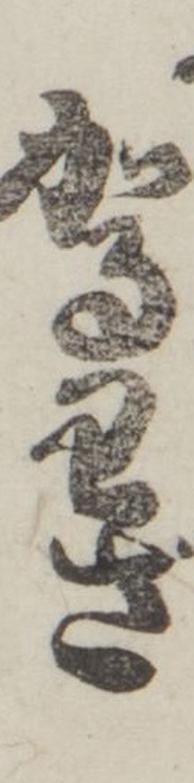かるわざ
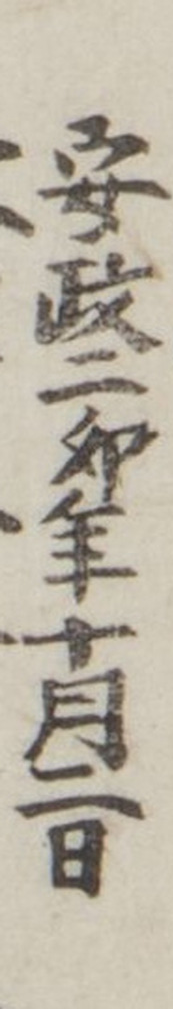安政二卯年十月二日
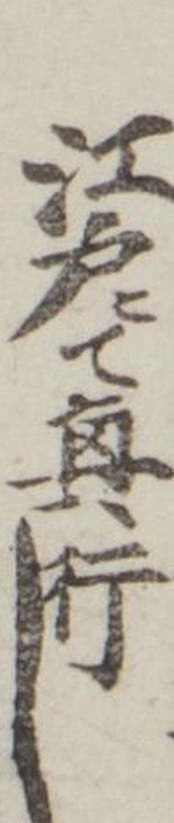江戸にて興行
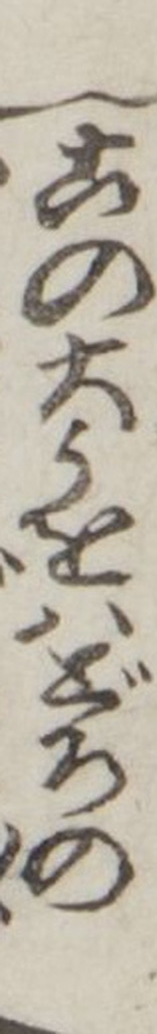〽この大うをはどろの
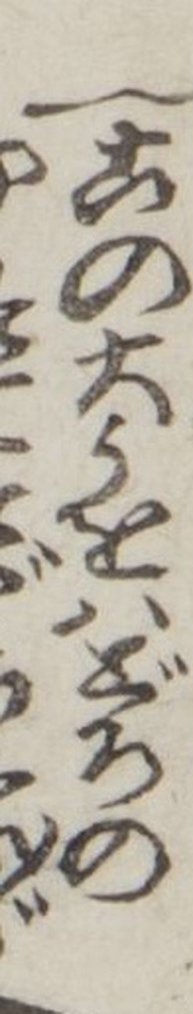〽この大うをはどろの
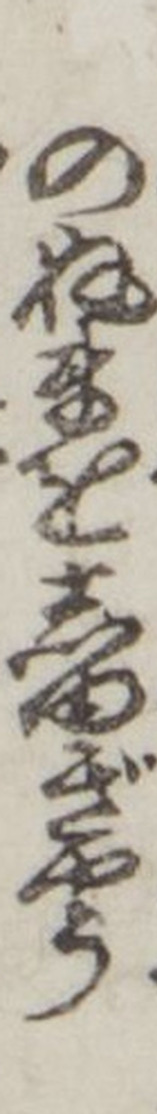のぬまをしゆぎやう
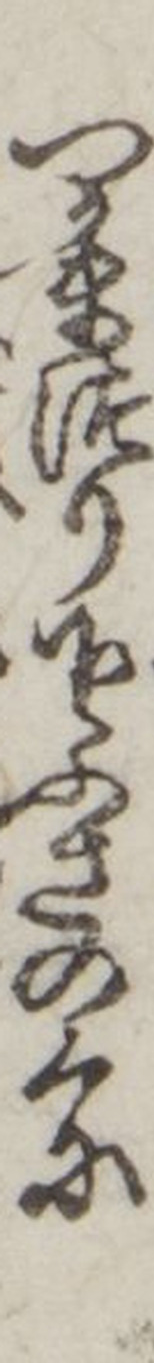つかまつり下ふさのくに
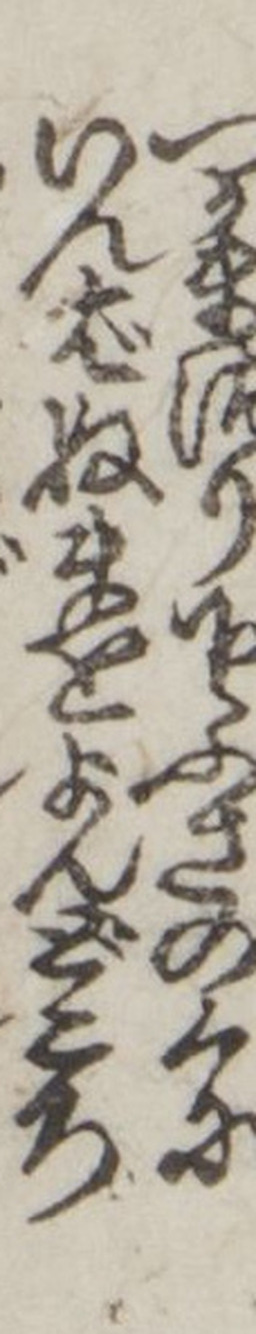いんばぬまをよんどころ
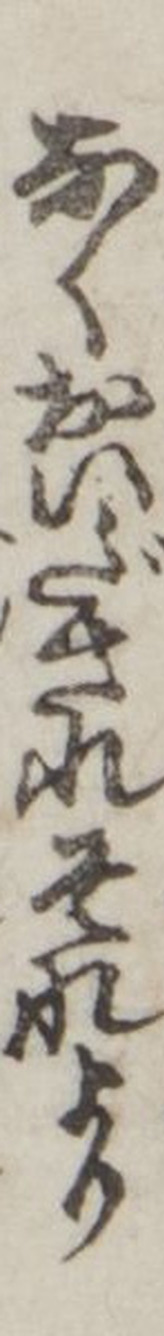なくおいだされそれより
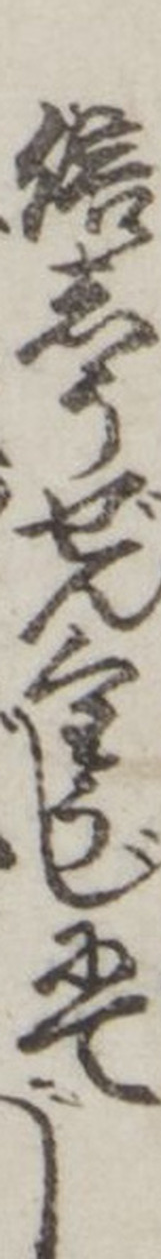信しうぜんくわうじにて
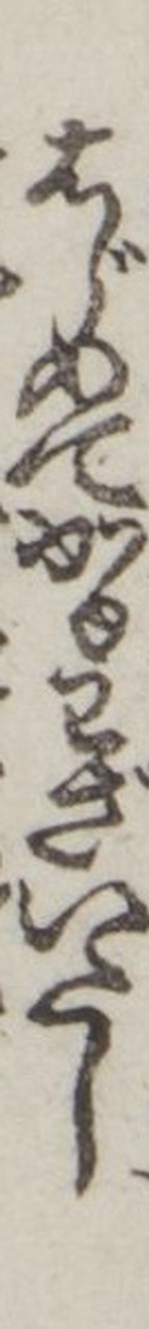はじめてかるわざいたし
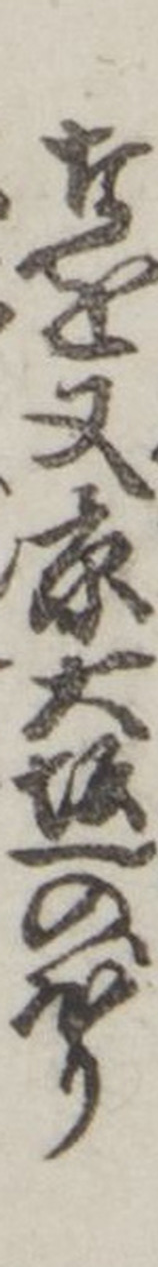なを又京大坂へのほり
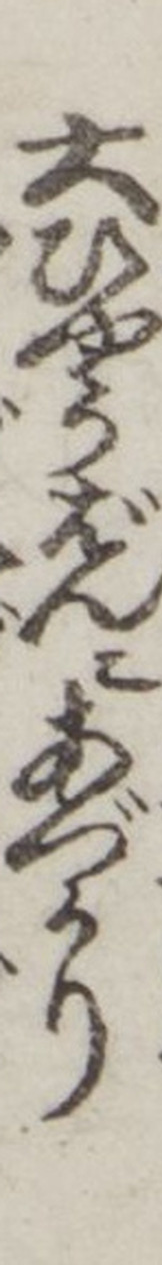大ひやうばんにあづかり
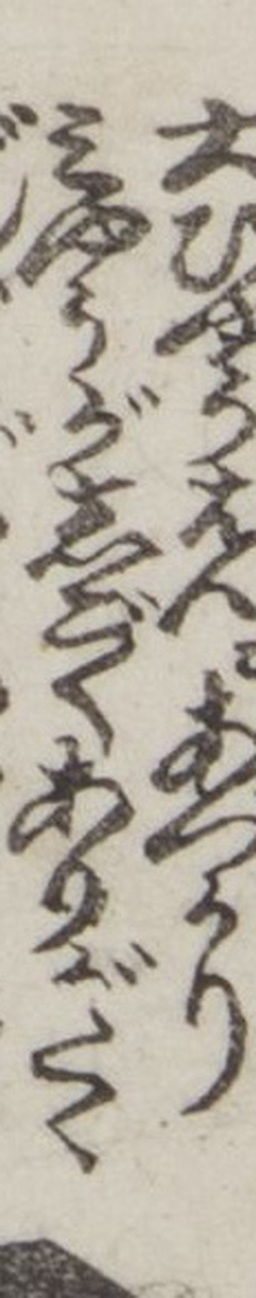みやうがしごくありがたく
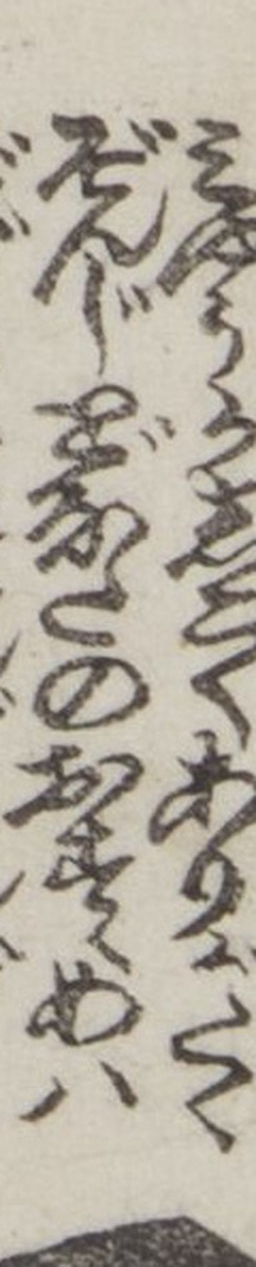ぞんじどなたのおすゝめは
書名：大坂下りなまずのかるわざ
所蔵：あいおいニッセイ同和損保株式会社
